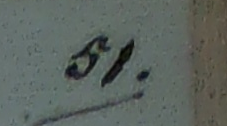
51.
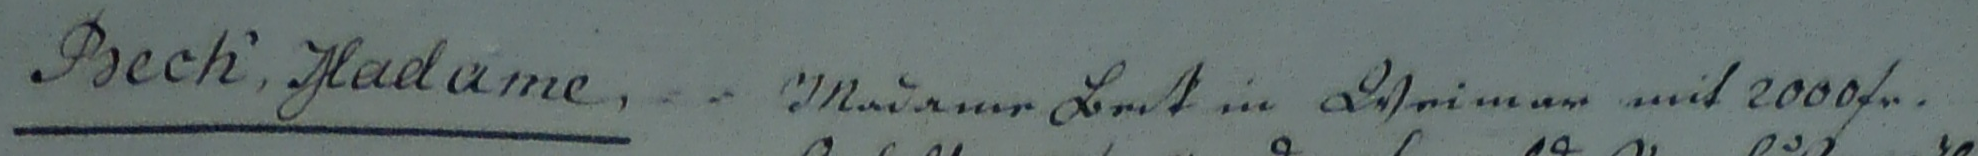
Beck, Madame, : : Madame Beck in Weimar mit 2000fr.
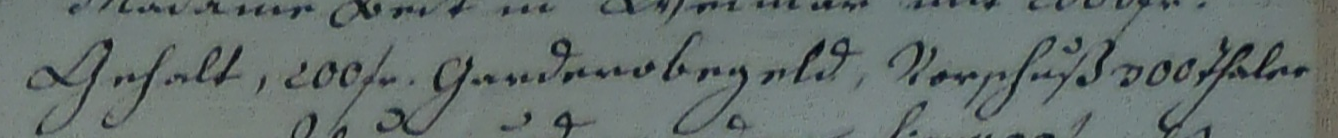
Gehalt, 200fr. Garderobegeld, Vorschuß 300 Thaler
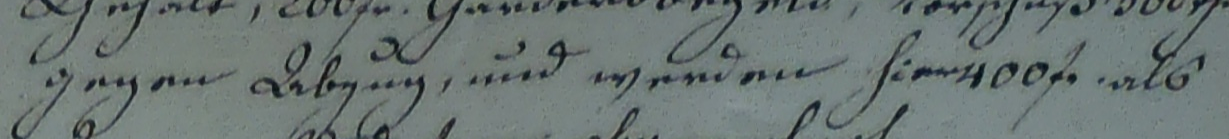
gegen Abzug, und werden hier 400fr. als
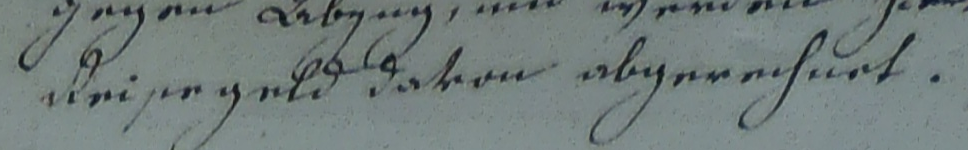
Reisegeld davon abgerechnet.
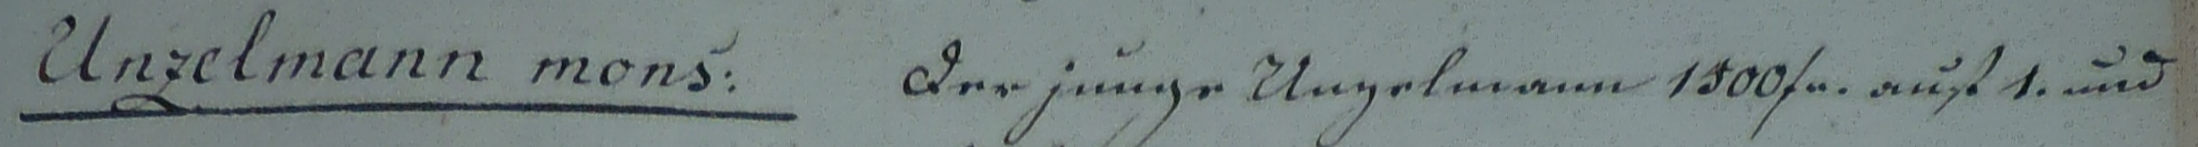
Unzelmann mons: Der junge Unzelmann 1500fr. auf 1 und
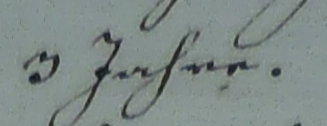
3 Jahre.
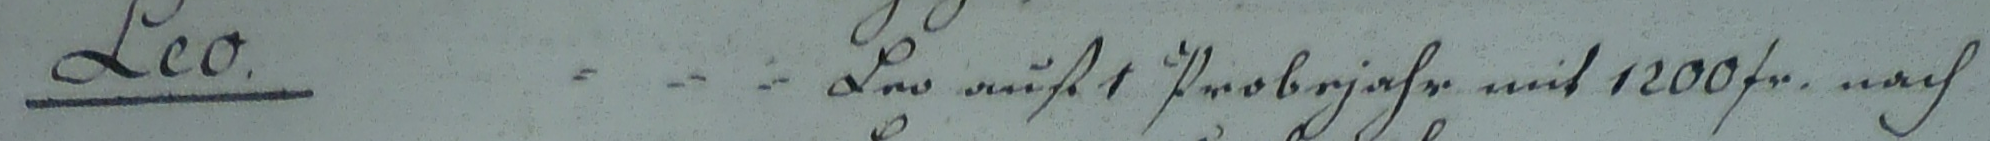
Leo. : : : Leo auf 1 Probejahr mit 1200 fr. nach
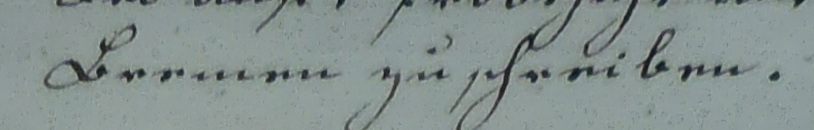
Bremen zu schreiben.
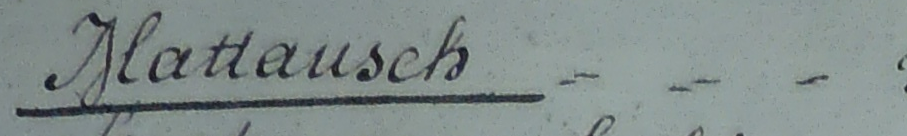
Mattausch : : :
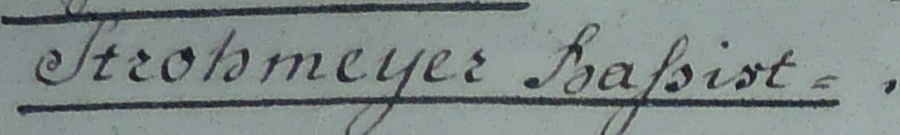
Strohmeyer Bassist ‗
